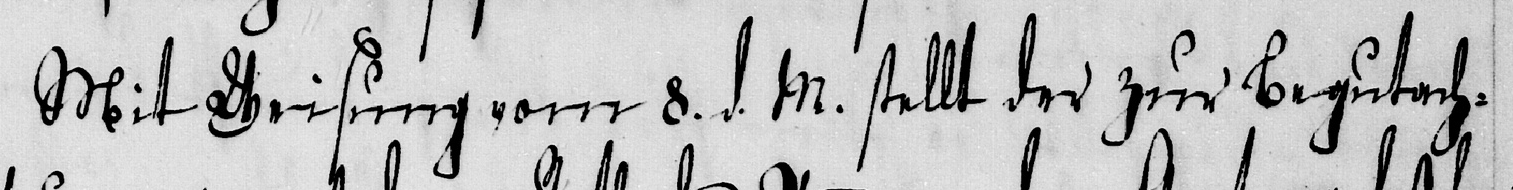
Mit Weisung vom 8. d. M. stellt der zur Begutach¬
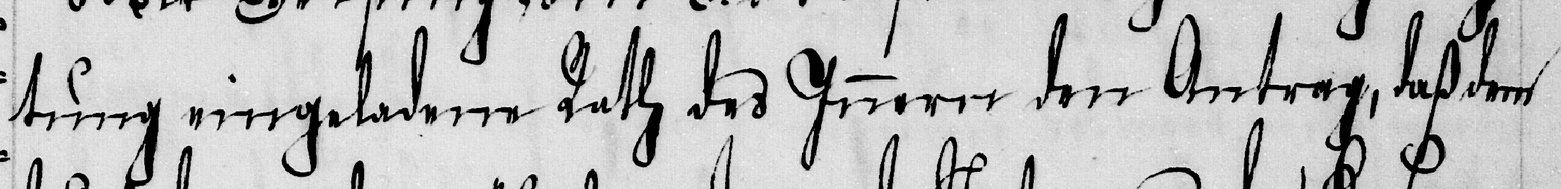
tung eingeladene Rath des Innern den Antrag, daß dem
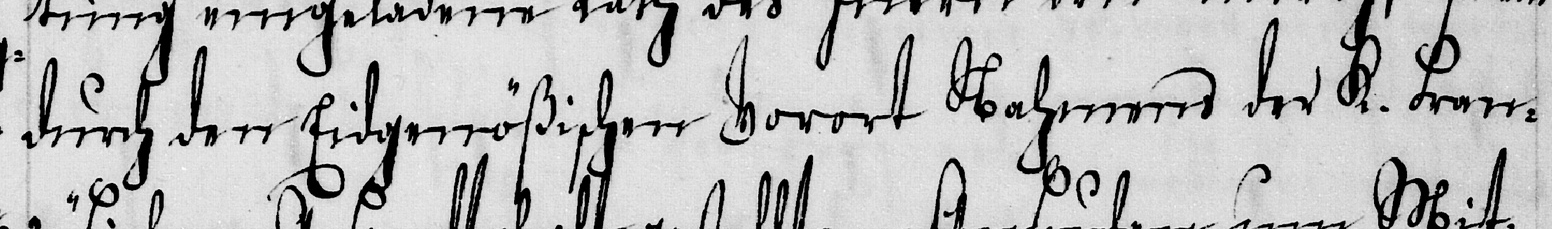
durch den Eidgenößischen Vorort Nahmens der K. Fran¬
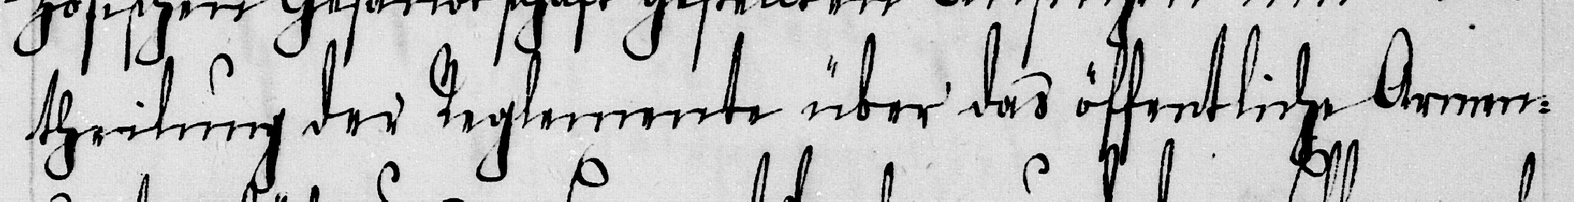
theilung der Reglemente über das öffentliche Armen¬
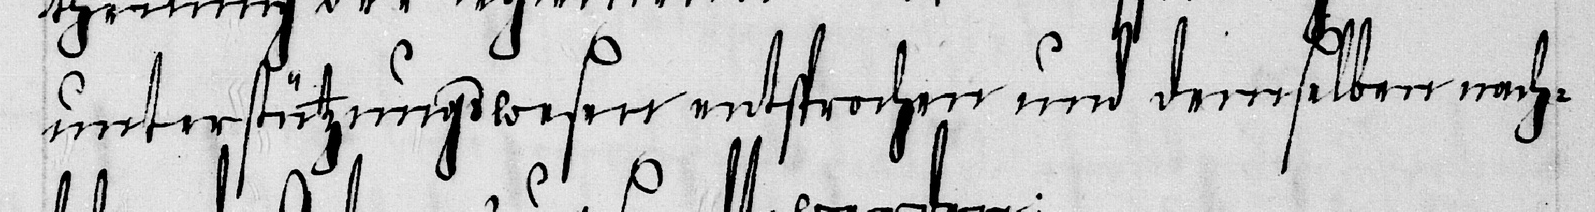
unterstützungswesen entsprochen und demselben nach¬
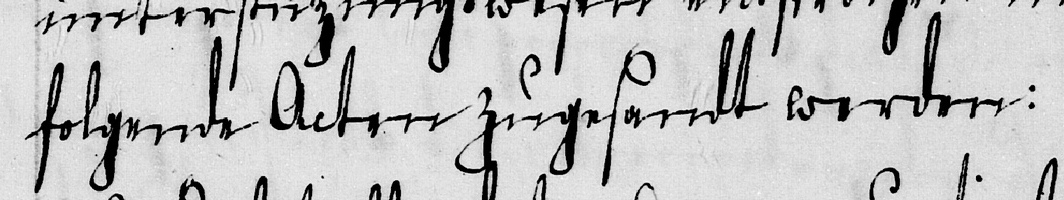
folgende Acten zugesandt werden:
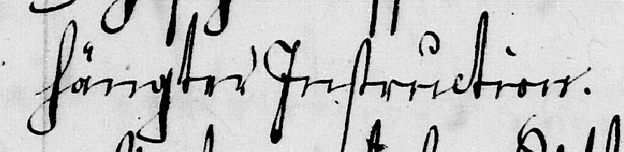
hängter Instruction.
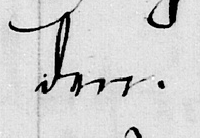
aden.
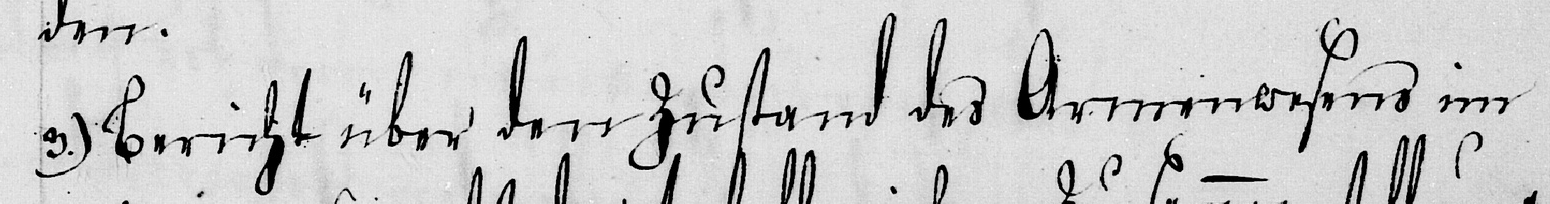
3.) Bericht über den Zustand des Armenwesens im
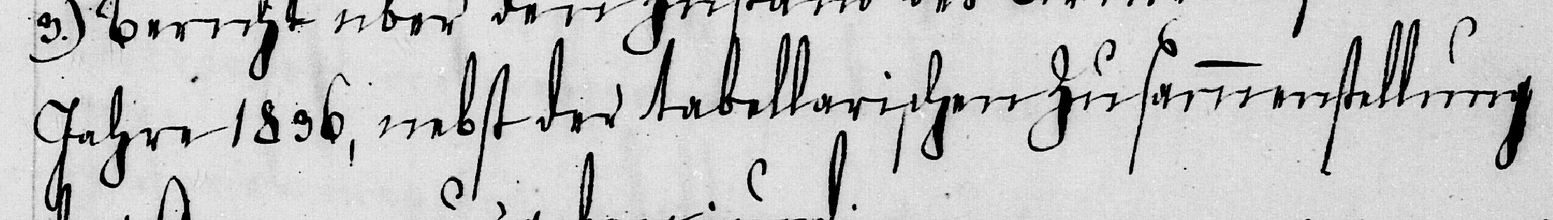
Jahre 1836, nebst der tabellarischen Zusammenstellung
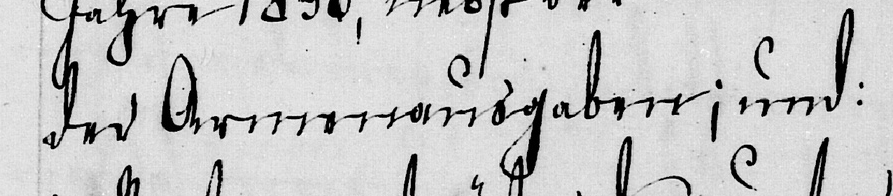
der Armenausgaben; und:
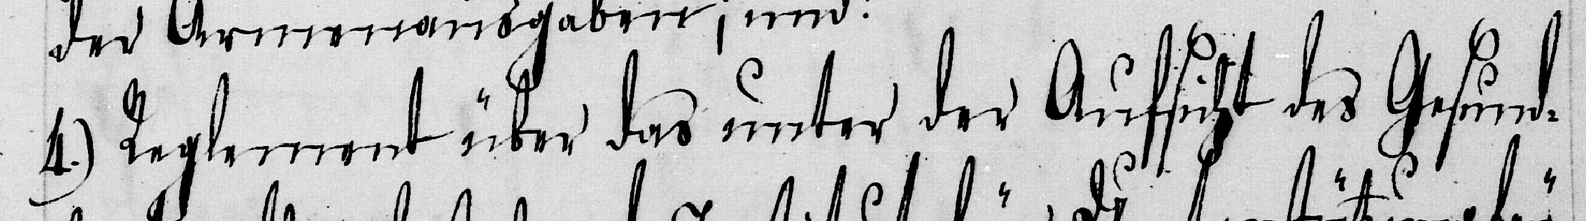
4.) Reglement über das unter der Aufsicht des Gesund¬
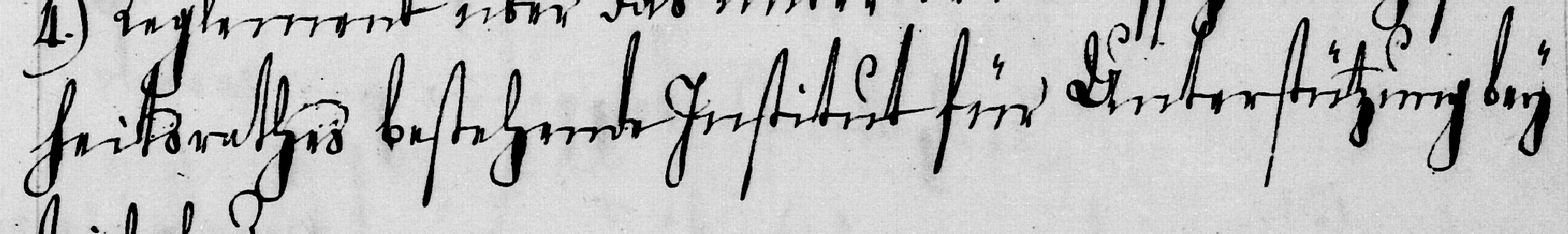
heitsrathes bestehende Institut für Unterstützung bey
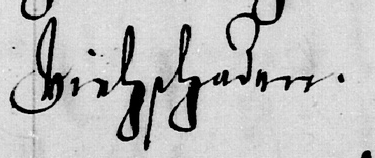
Viehschaden.
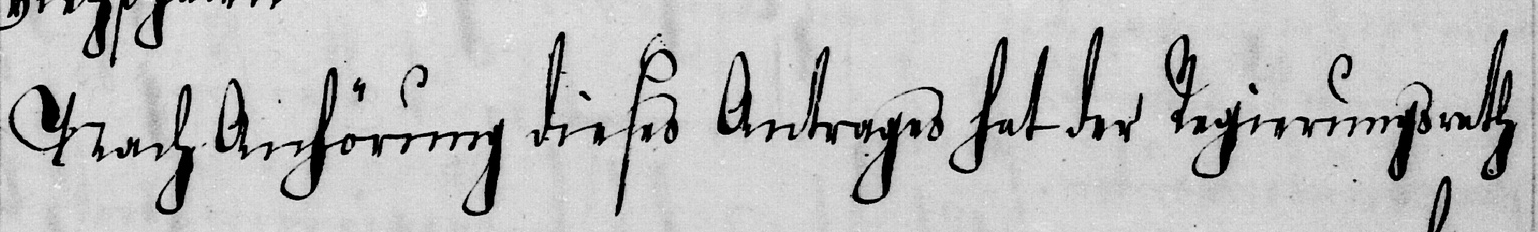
Nach Anhörung dieses Antrages hat der Regierungsrath
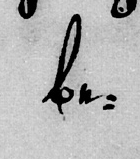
be
